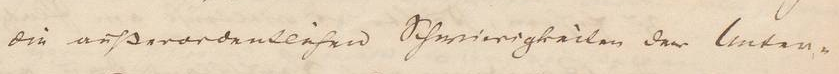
die außerordentlichen Schwierigkeiten der Unter-
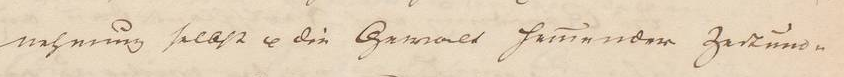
nehmung selbst & die Gewalt hemmender Zeit um-
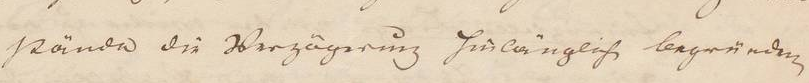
stände die Verzögerung hinlänglich begründen –
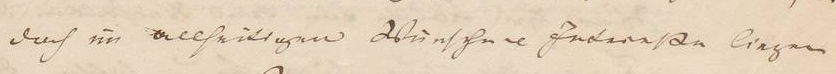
doch im allseitigen Wunsche & Intereße liegen
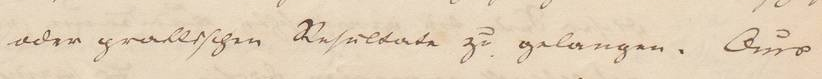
oder praktischen Resultate zu gelangen. Aus
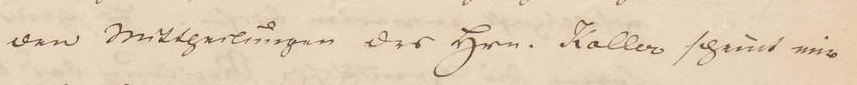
den Mittheilungen des Hrn. Koller scheint mir
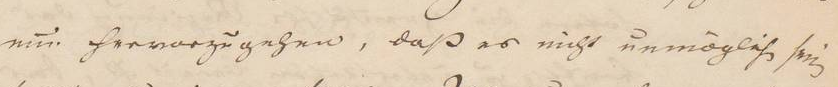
nun hervorzugehen, daß es nicht unmöglich sein
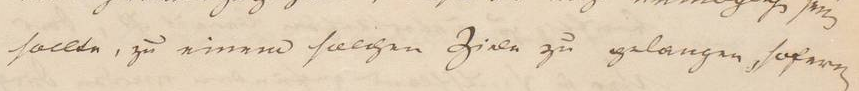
sollte, zu einem solchen Ziele zu gelangen, sofern
